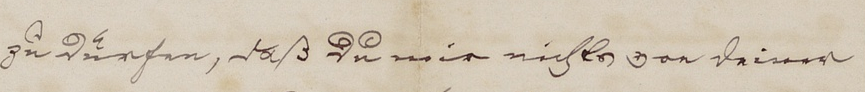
zu dürfen, daß Du mir nichts von Deiner
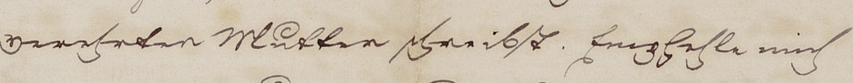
verehrten Mutter schreibst. Emphehle mich
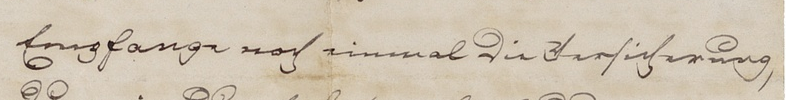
Empfange noch einmal die Versicherung,
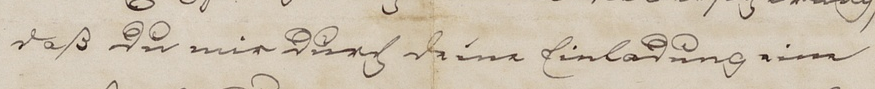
daß Du mir durch Deine Einladung eine
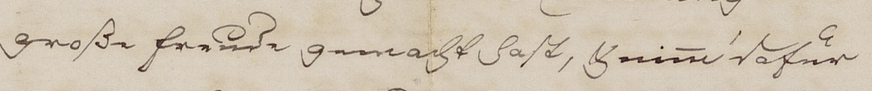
große Freude gemacht hast, & nimm dafür
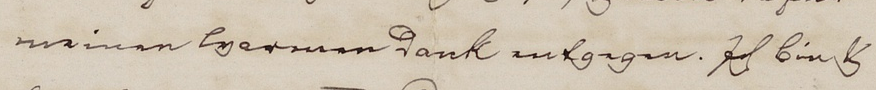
meinen warmen Dank entgegen. Ich bin &
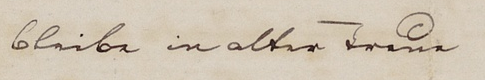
bleibe in alter Treue
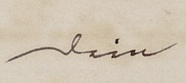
Dein
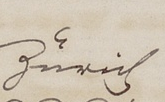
Zürich
